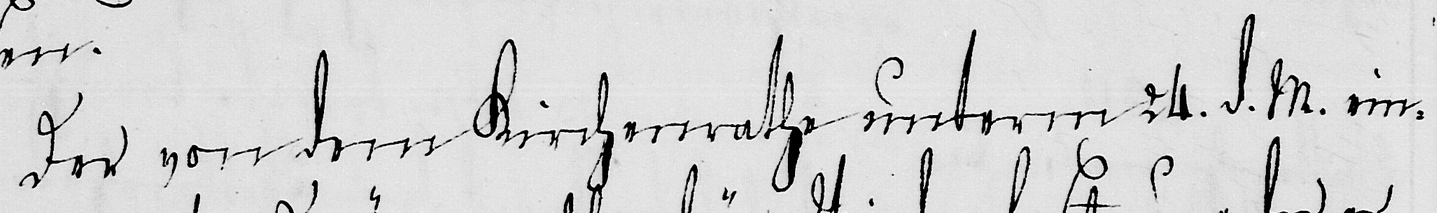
Der von dem Kirchenrathe unterm 24. d. M. ei¬
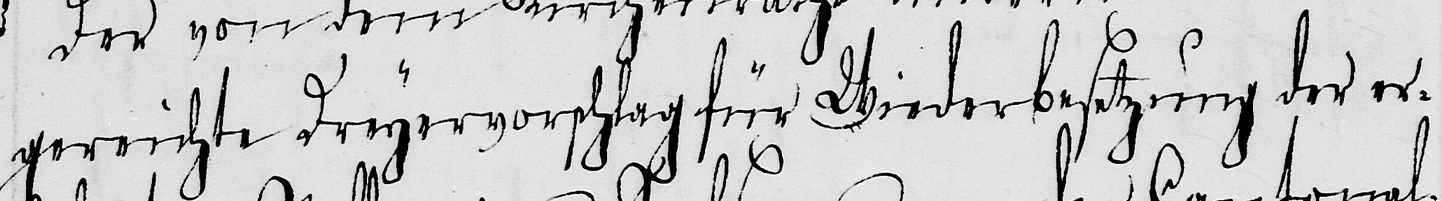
ngereichte Dreyervorschlag für Wiederbesetzung der er¬
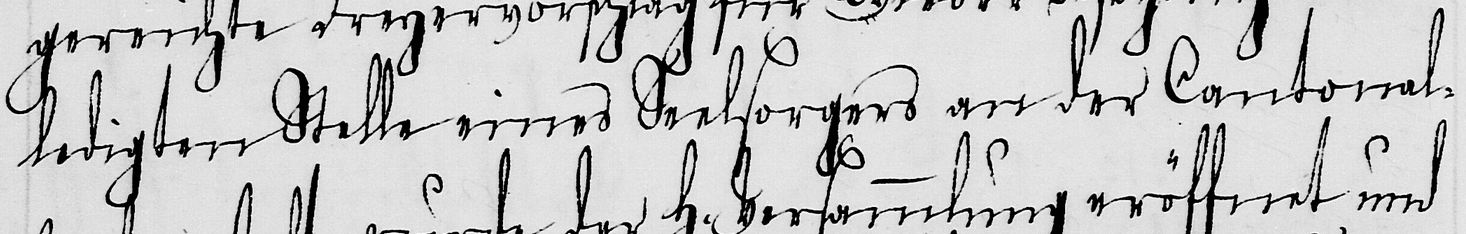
ledigten Stelle eines Seelsorgers an der Cantonal¬
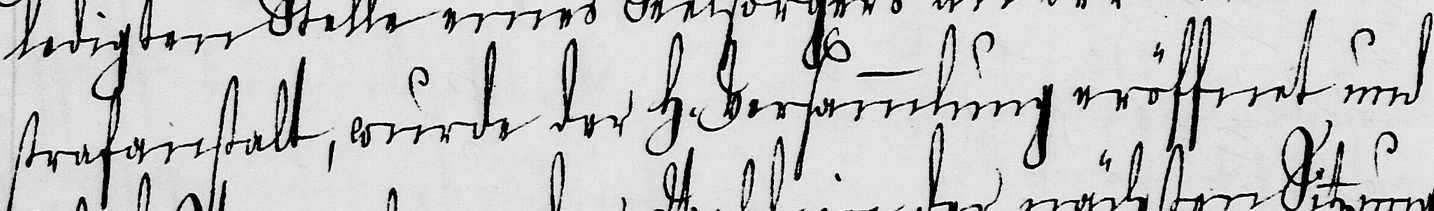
strafanstalt, wurde der H. Versammlung eröffnet und
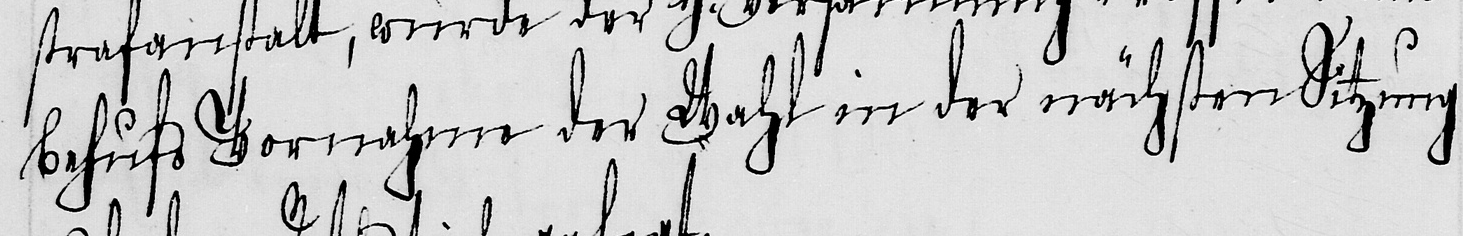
Behufs Vornahme der Wahl in der nächsten Sitzung
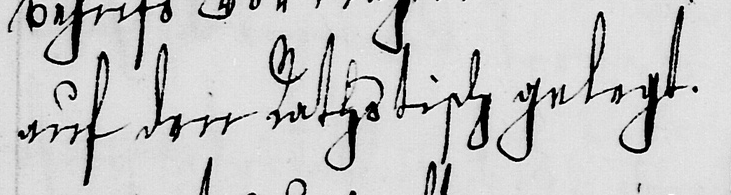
auf den Rathstisch gelegt.
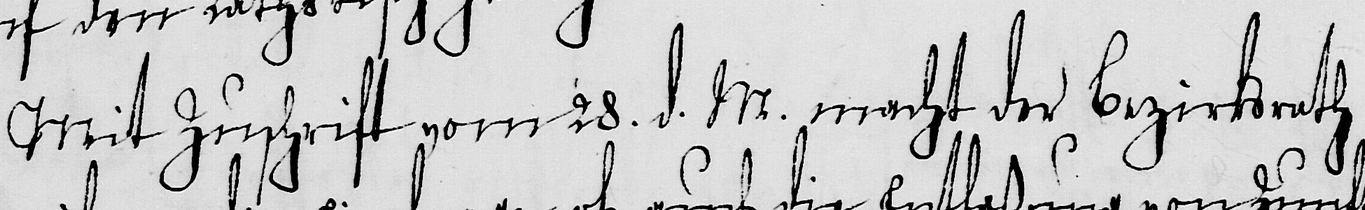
Mit Zuschrift vom 28. d. M. macht der Bezirksrath
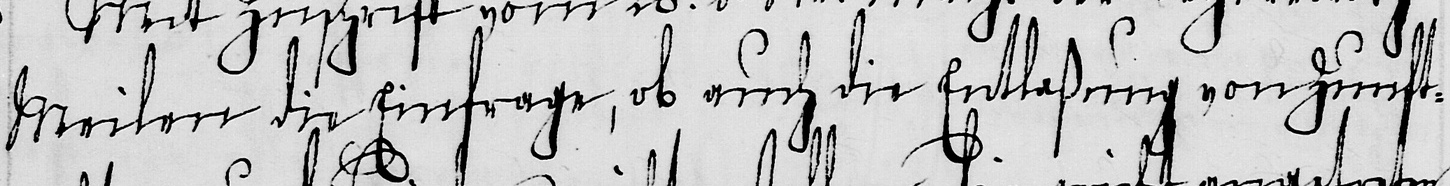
Meilen die Einfrage, ob auch die Entlaßung von Zunft¬
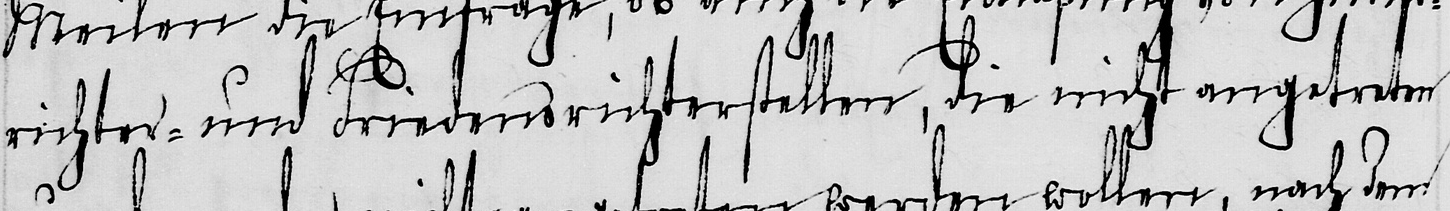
richter- und Friedensrichterstellen, die nicht angetreten
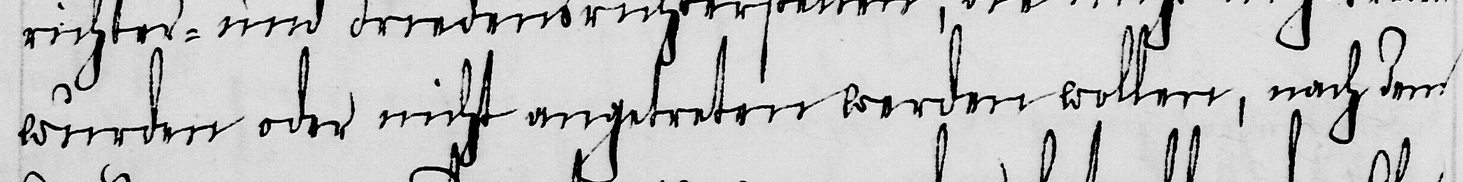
wurden oder nicht angetreten werden wollen, nach dem
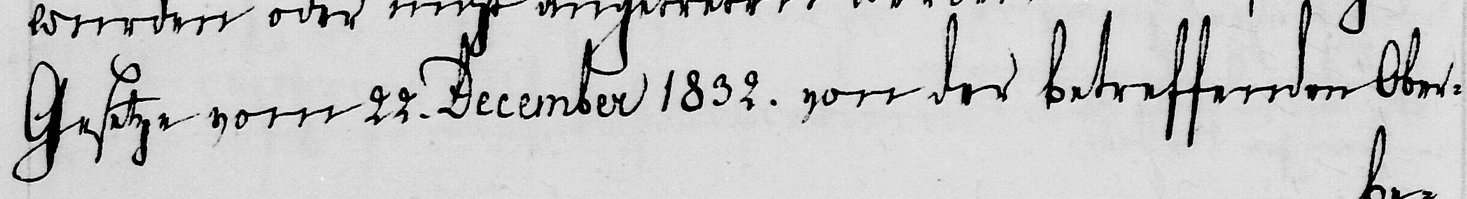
Gesetze vom 22. December 1832. von der betreffenden Ober-
